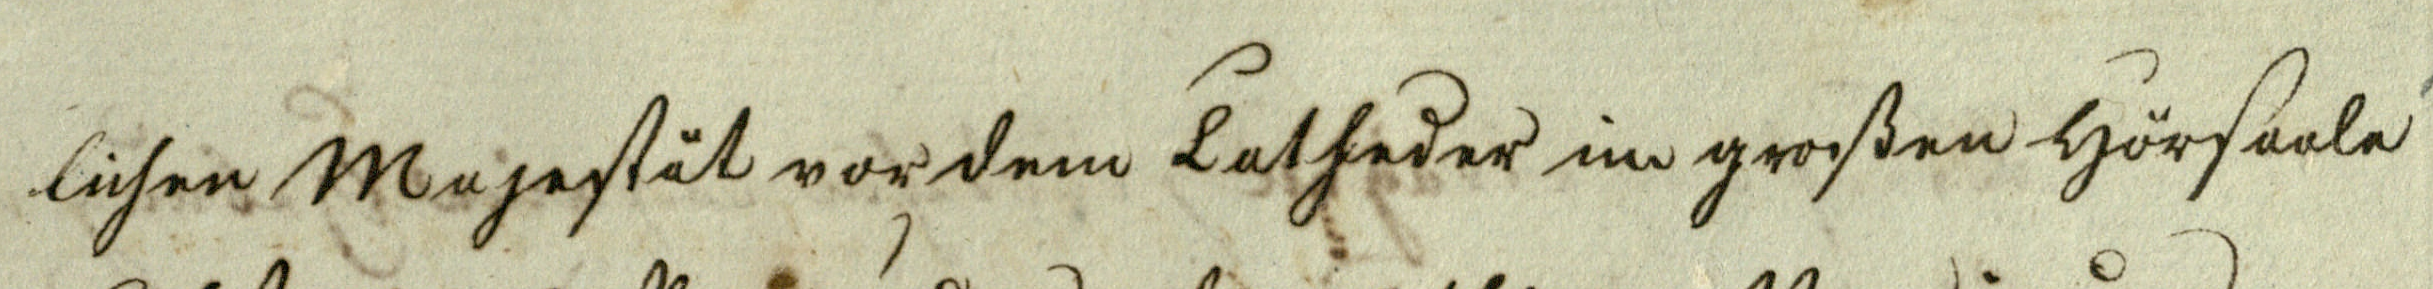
lichen Majestät vor dem Catheder im großen Hörsaale
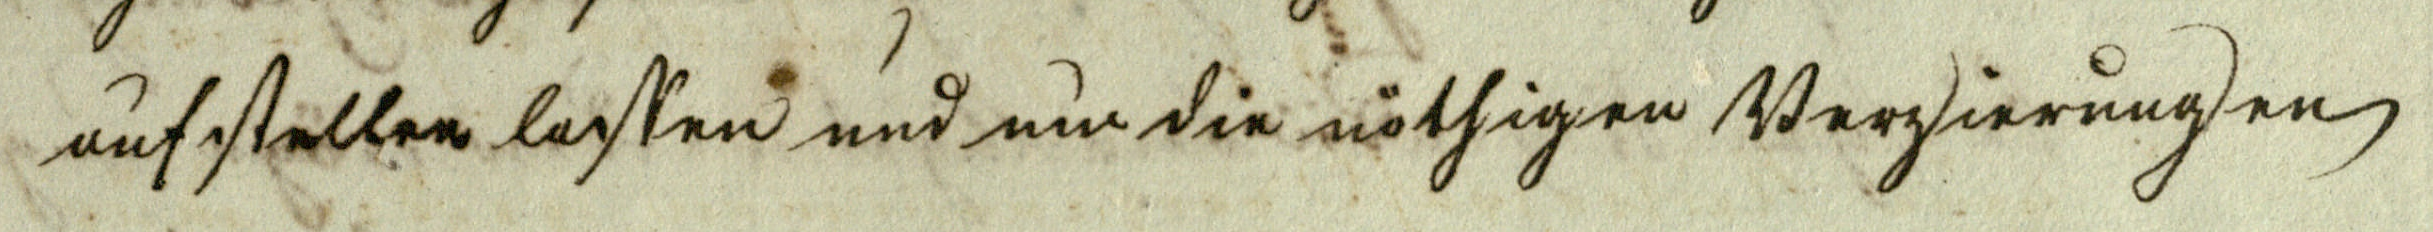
aufstellen lassen und um die nöthigen Verzierungen
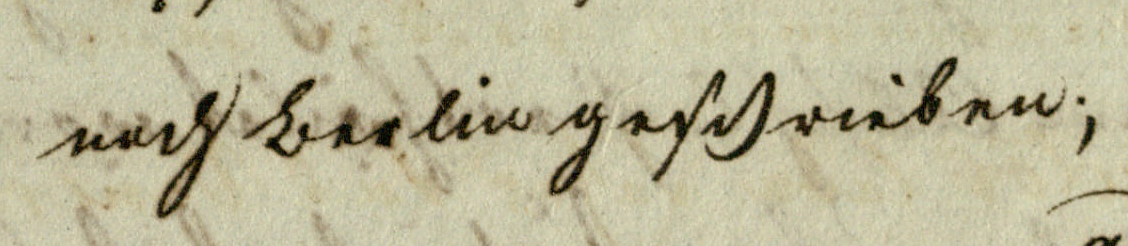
nach Berlin geschrieben;
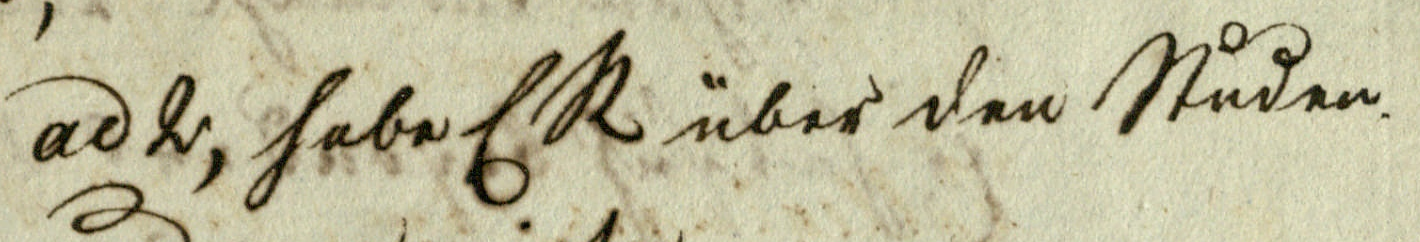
ad 2, habe E R über den Studen¬
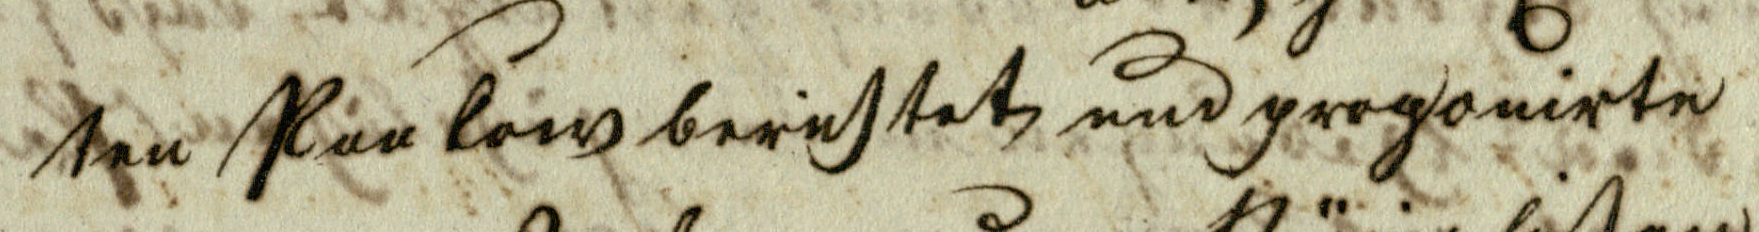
ten Pankow berichtet, und proponirte
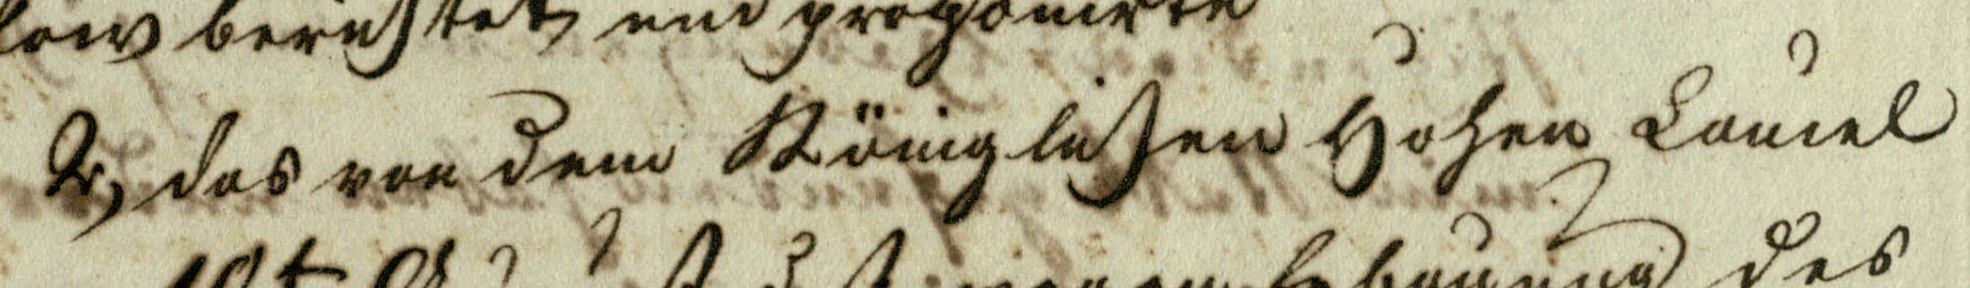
2, das von dem Könglichen Hohen Cancel¬
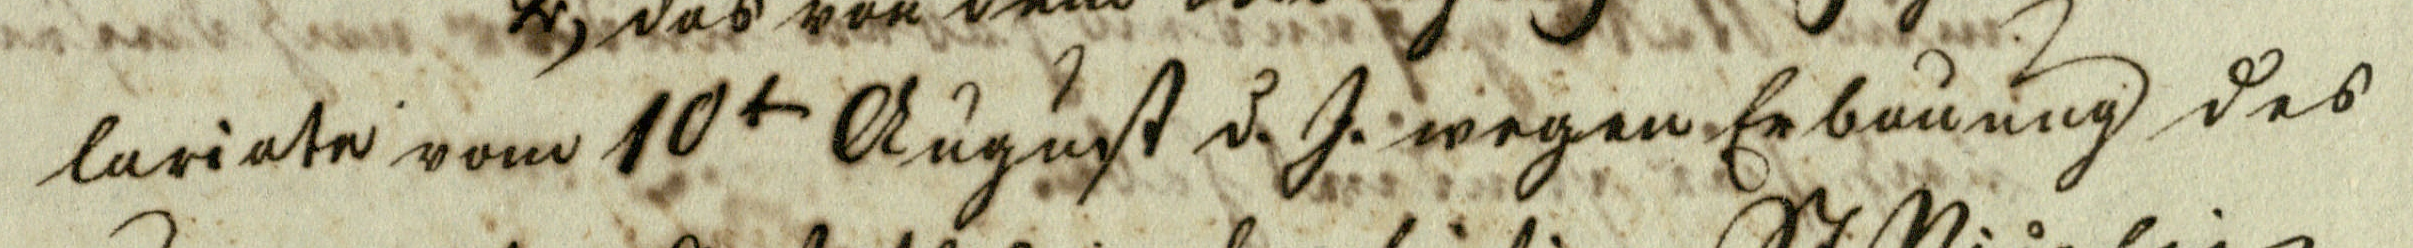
lariate vom 10 t August d. J. wegen Erbauung des
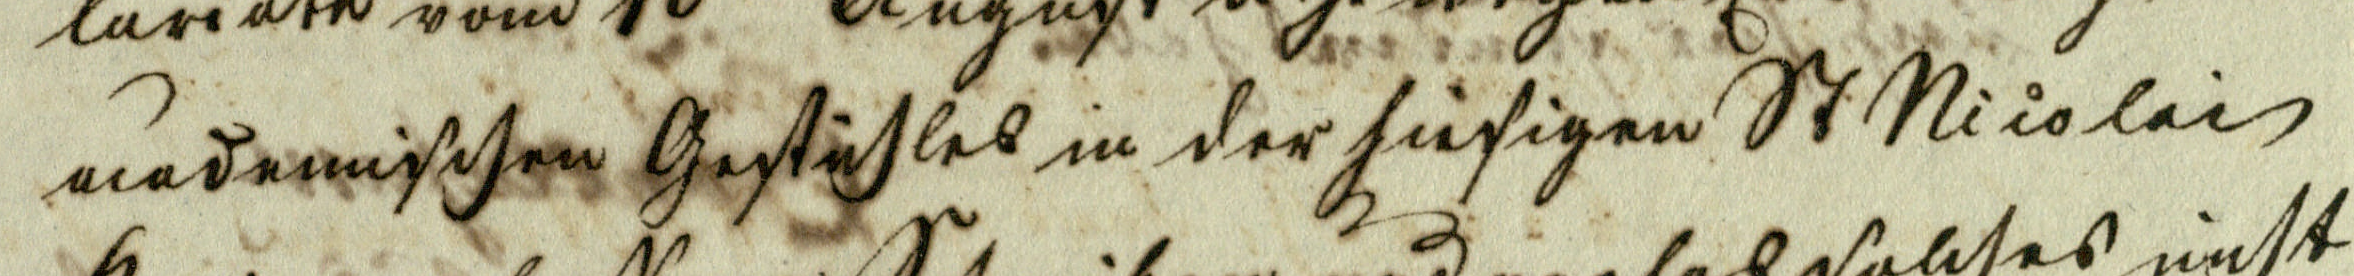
academischen Gestühles in der hiesigen St Nicolai
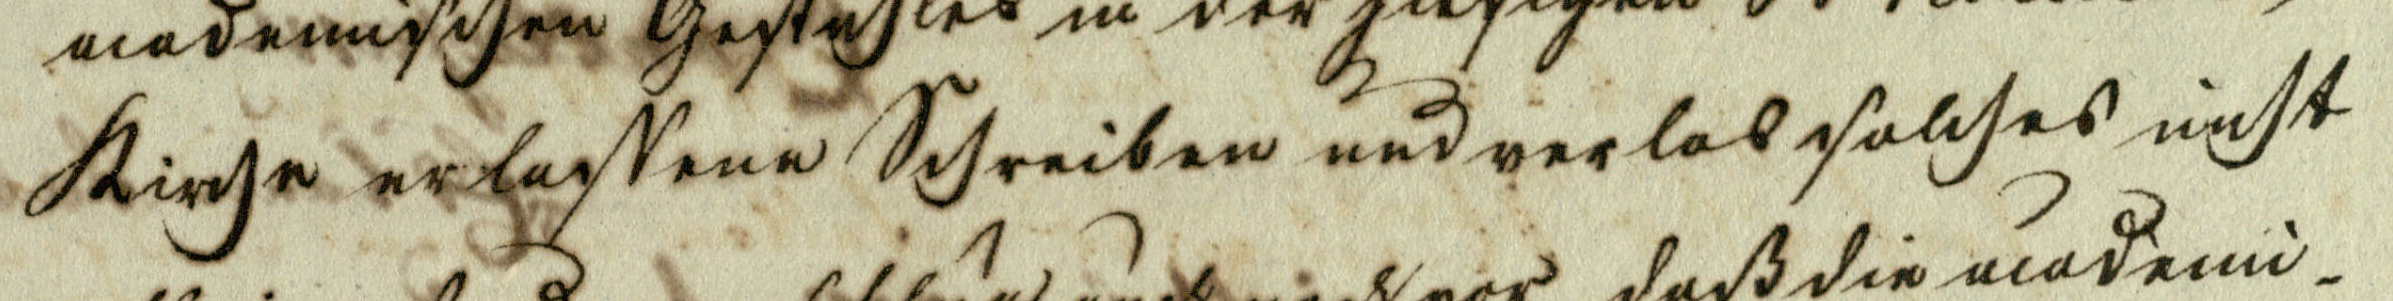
Kirche erlassene Schreiben und verlas solches nicht
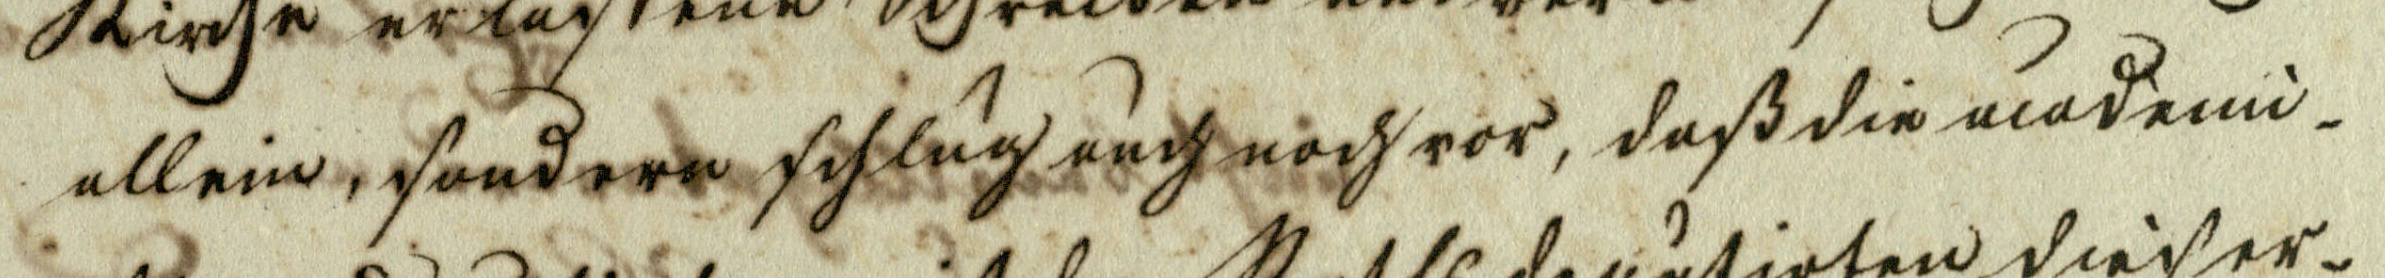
allein, sondern schlug auch noch vor, daß die academi¬
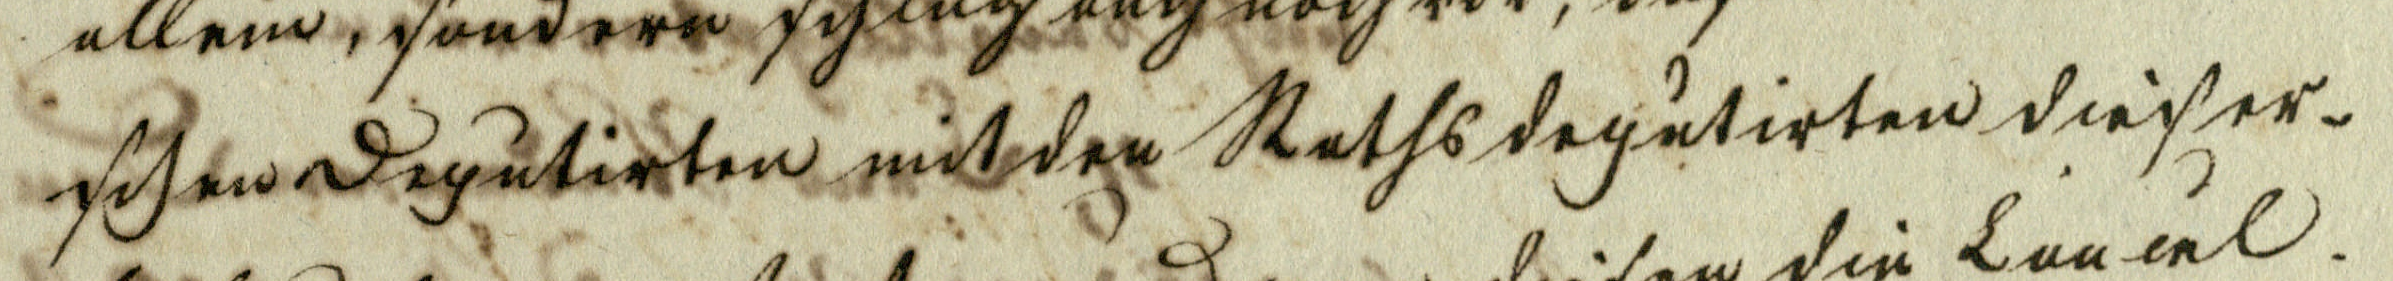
schen Deputirten mildern Rathsdeputirten dieser¬
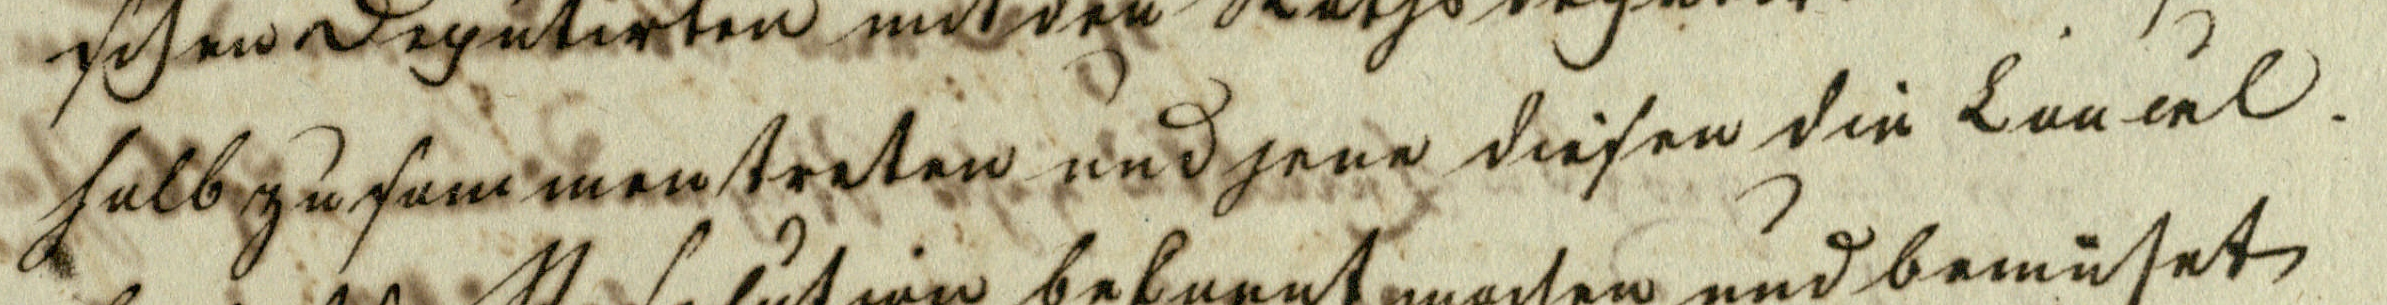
halb zusammentreten und jene diesen die Cancel¬
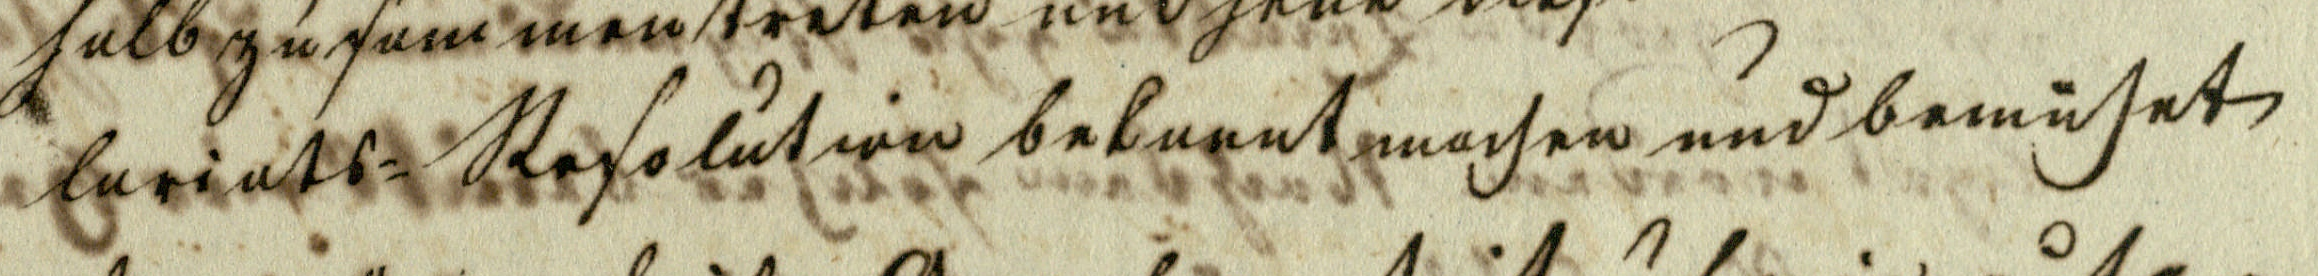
lariats Resolution bekannt machen und bemühet
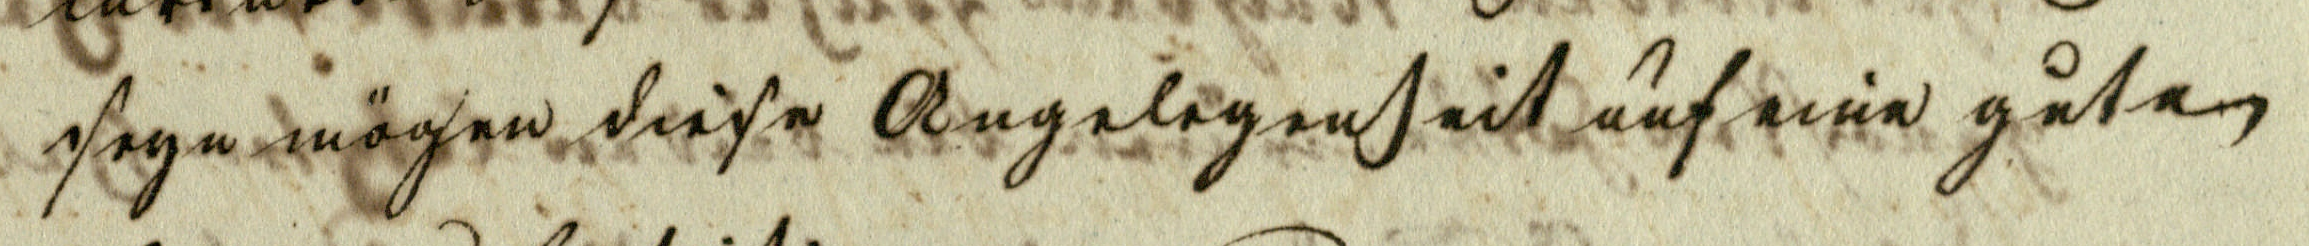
seyn mögen diese Angelegenheit auf eine gute
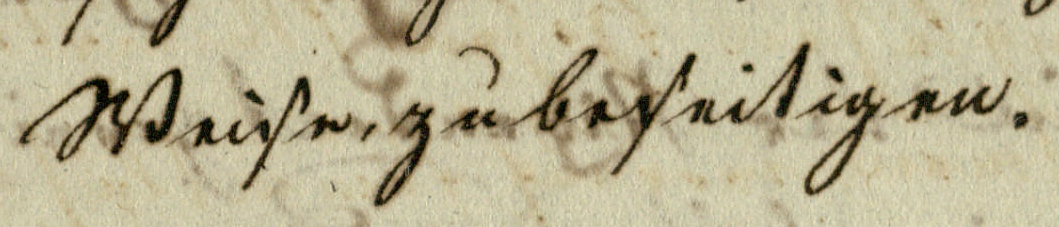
Weise zubeseitigen.
